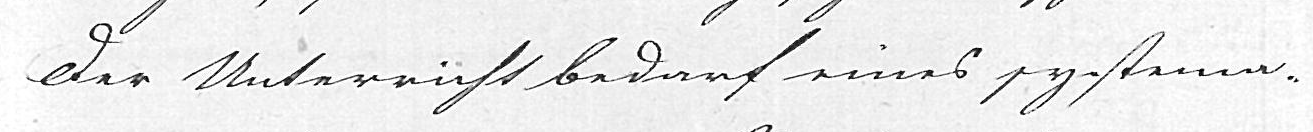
Der Unterricht bedarf eines systema-
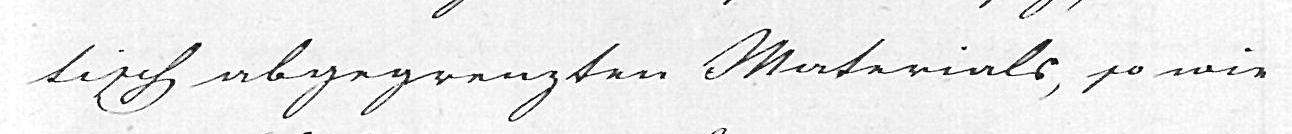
tisch abgegrenzten Materials, so wie
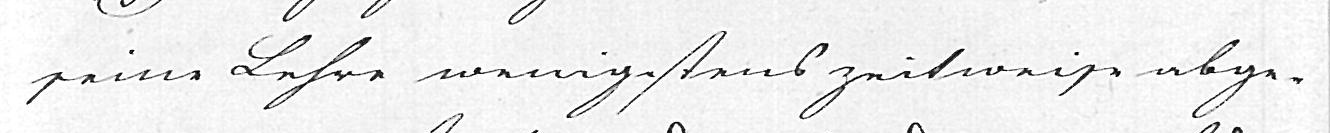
seine Lehre wenigstens zeitweise abge-
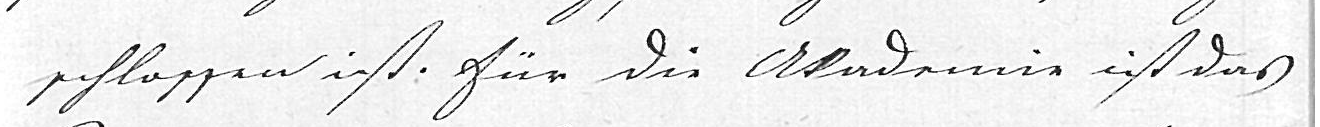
schlossen ist. Für die Akademie ist das
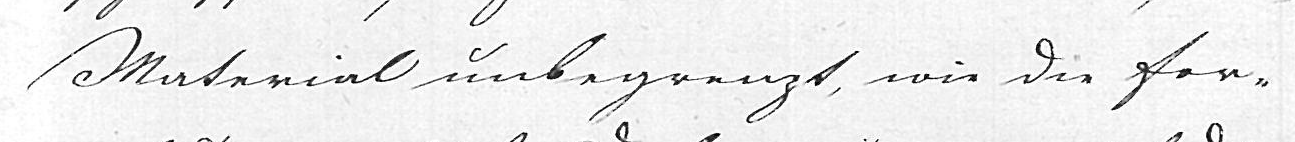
Material unbegrenzt, wie die For-
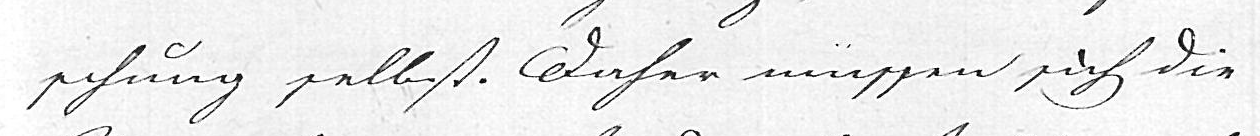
schung selbst. Daher müssen sich die
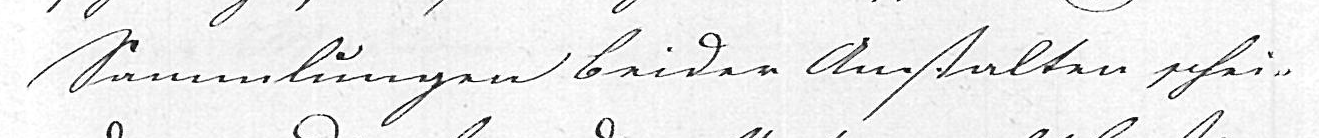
Sammlungen beider Anstalten schei-
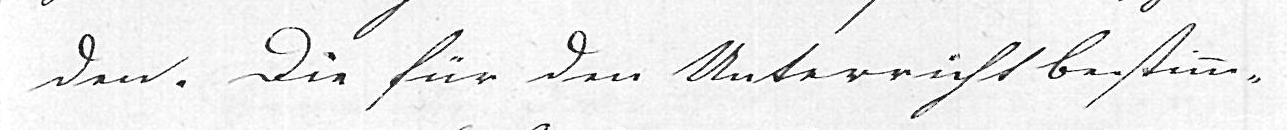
den. Die für die Unterricht bestimm-
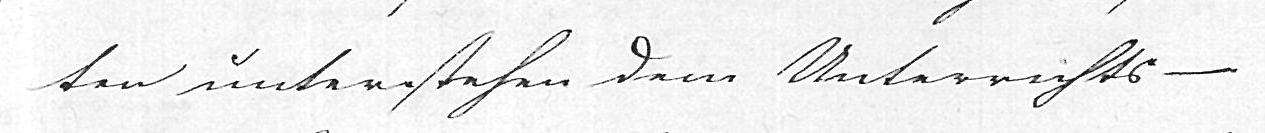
ten unterstehen dem Unterrichts-
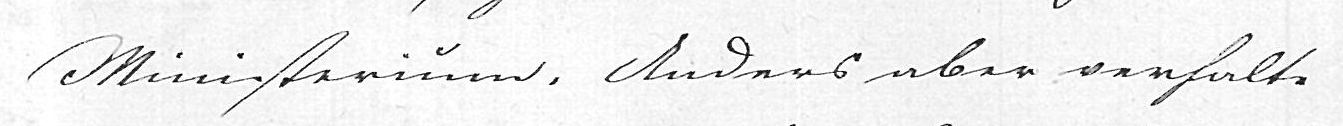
Ministerium. Anders aber verhalte
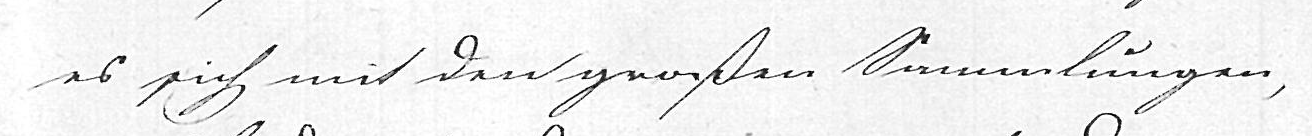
es sich mit den großen Sammlungen,
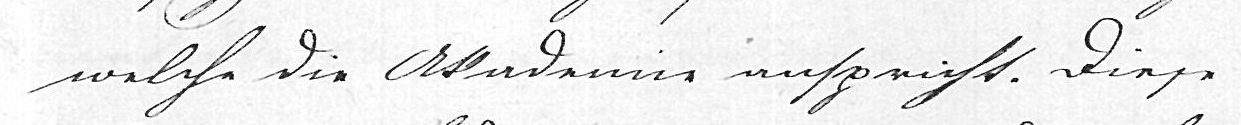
welche die Akademie anspricht. Diese
